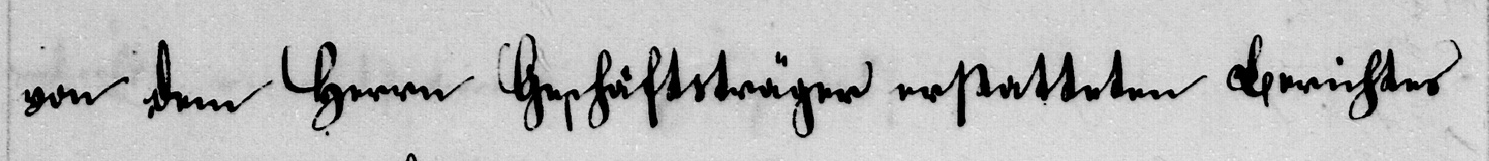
von dem Herrn Geschäftsträger erstatteten Berichtes
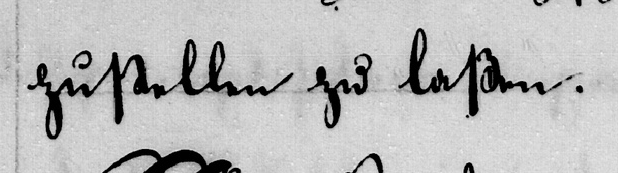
zustellen zu laßen.
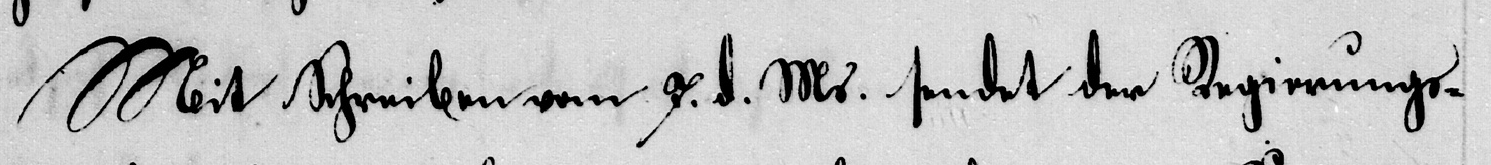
Mit Schreiben vom 7. d. Ms. sendet der Regierungs¬
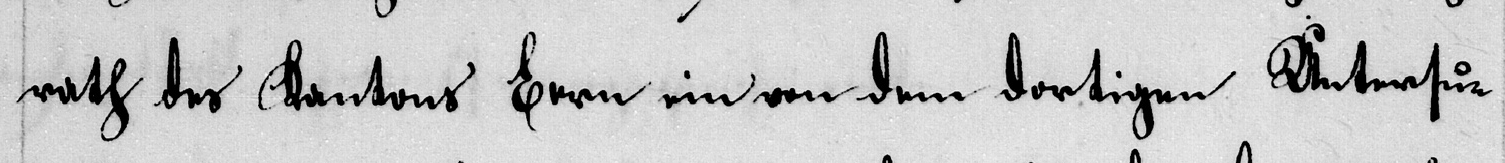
rath des Kantons Bern ein von dem dortigen Untersu¬
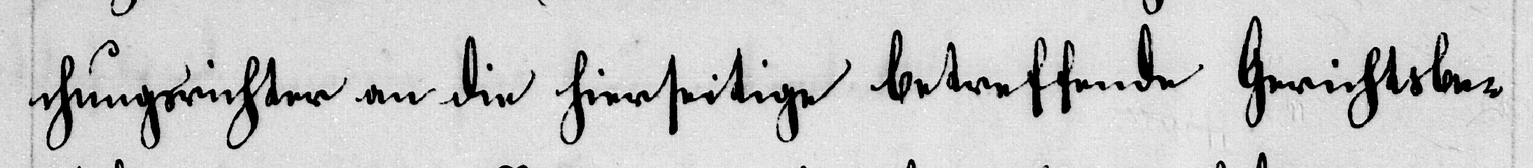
chungsrichter an die hierseitige betreffende Gerichtsbe¬
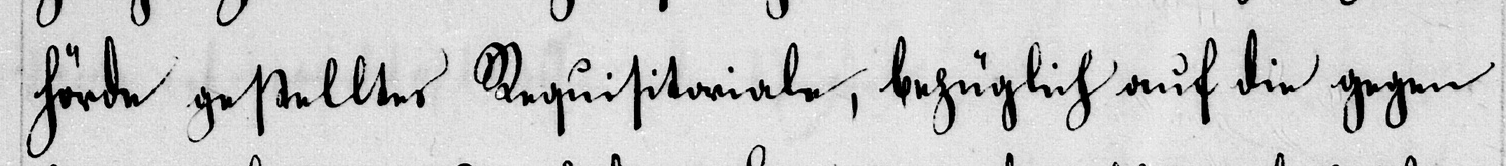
hörde gestelltes Requisitoriale, bezüglich auf die gegen
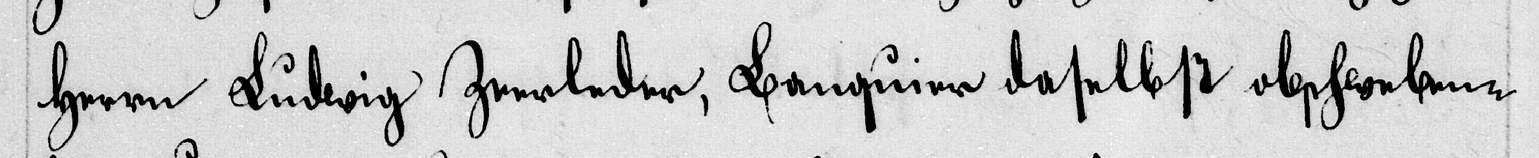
Herrn Ludwig Zeerleder, Banquier daselbst obschweben¬
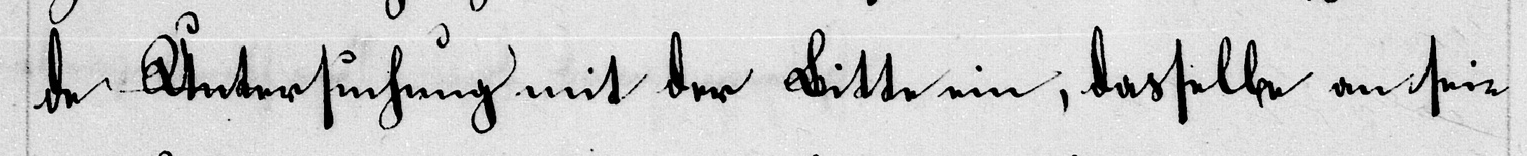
de Untersuchung mit der Bitte ein, dasselbe an sei¬
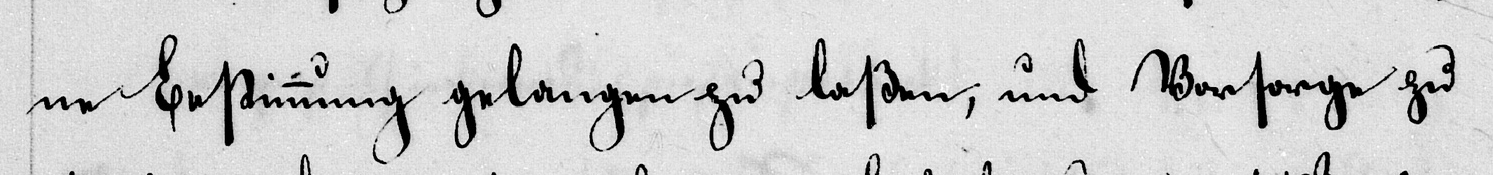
ne bestimmung gelangen zu laßen, und Vorsorge zu
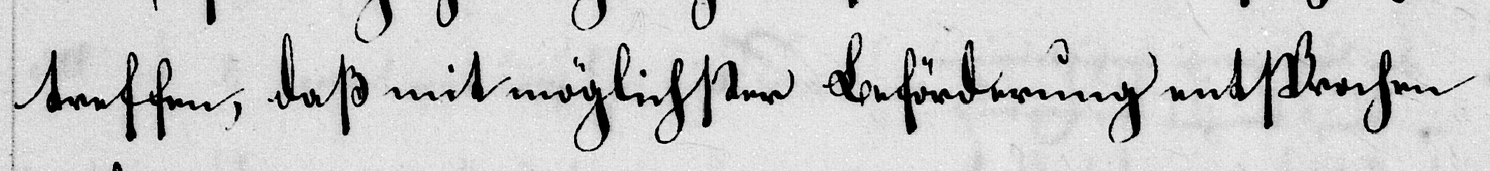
treffen, daß mit möglichster Beförderung entsprochen
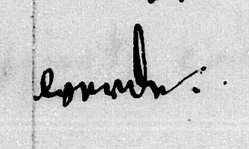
werde.
